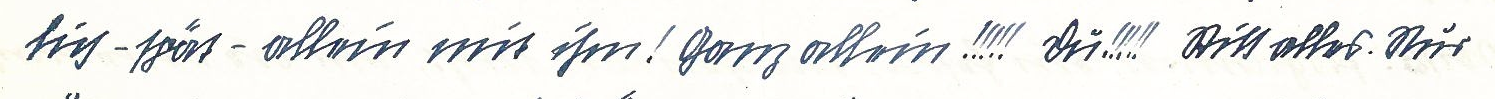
lich – spät – allein mit ihm! Ganz allein!!!!! Du!!!!! Still alles. Nur
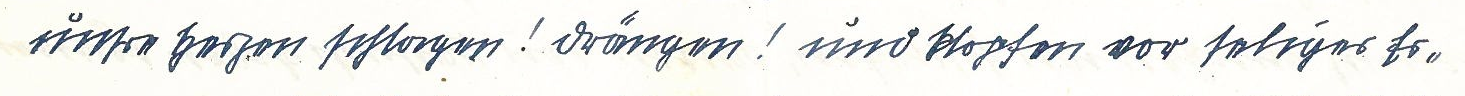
unsre Herzen schlagen! Drängen! und klopfen vor seliger Er¬
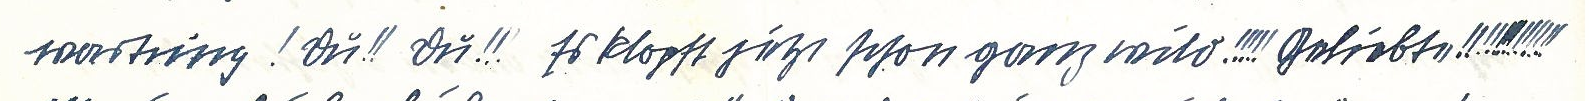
wartung! Du!! Du!!! Es klopft jetzt schon ganz wild!!!!! Geliebte!!!!!!!!!!!!!
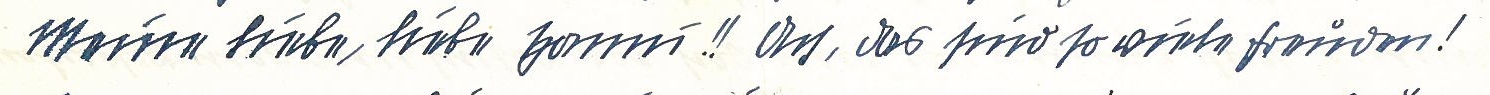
Meine liebe, liebe !! Ach, das sind so viele Freuden!
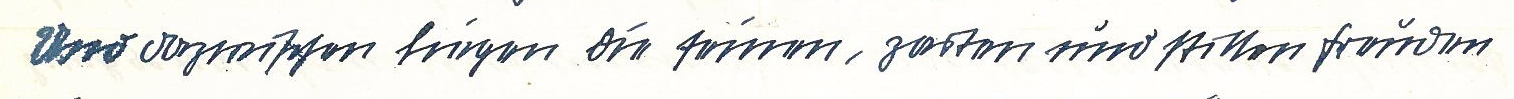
Und dazwischen liegen die feinen, zarten und stillen Freuden
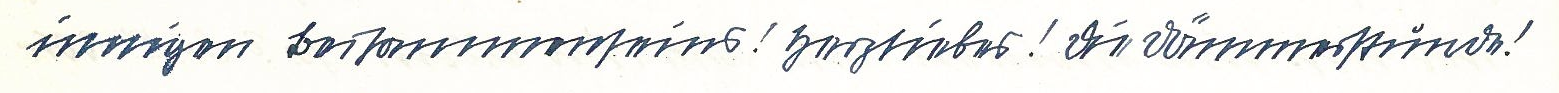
innigen Beisammenseins! Herzliebes! Die Dämmerstunde!
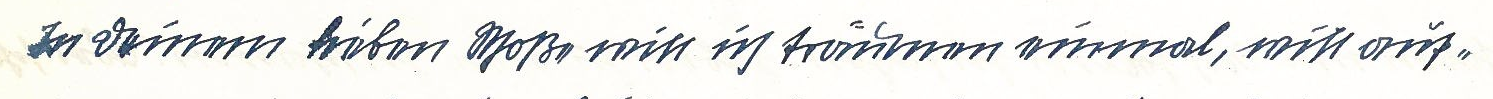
In Deinem lieben Schoße will ich träumen einmal, will ich auf¬
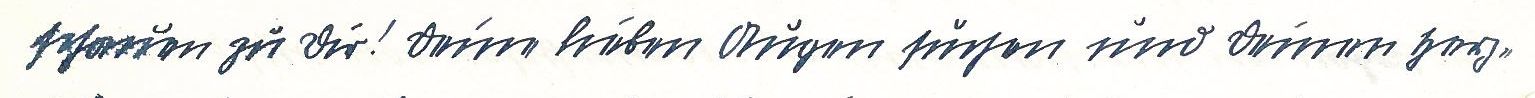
schauen zu Dir! Deine lieben Augen suchen und Deinen Herz¬
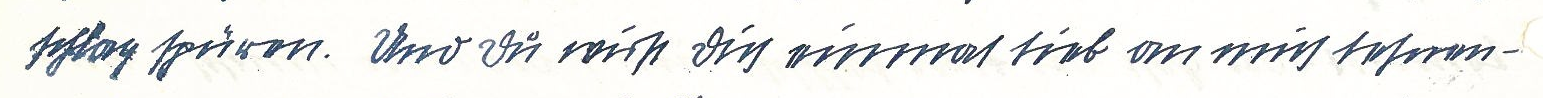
schlag spüren. Und Du wirst Dich einmal lieb an mich lehnen –
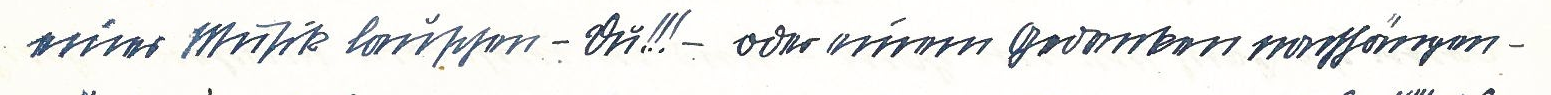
einer Musik lauschen – Du!!! – oder einem Gedanken nachhängen –
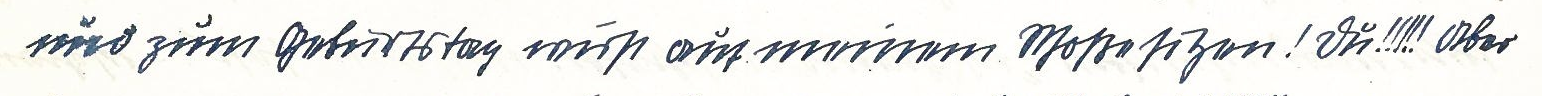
und zum Geburtstag wirst auf meinem Schoße sitzen! Du!!!!! Aber
